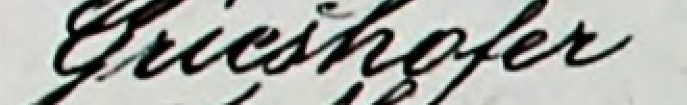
Grieshofer
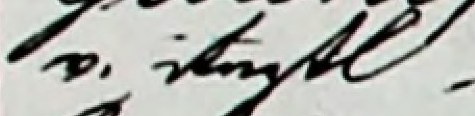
v. v. Rastl
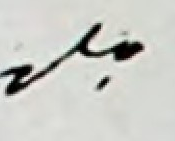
Do
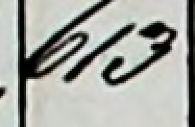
613
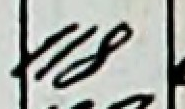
118
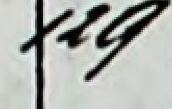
129
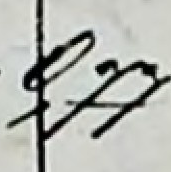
0,77
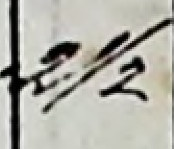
2 1/2
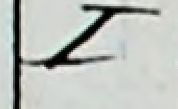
I
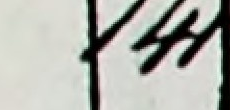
141
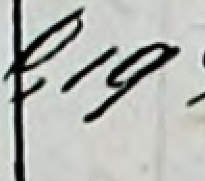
0,19
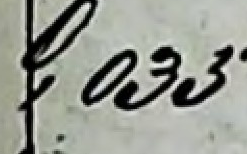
0,035
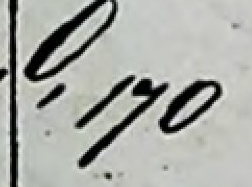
0,170
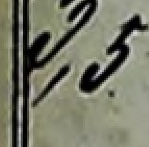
3,5
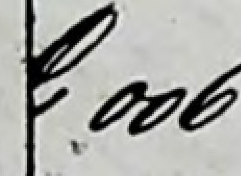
0,006
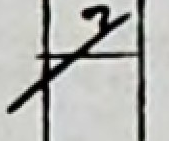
7
